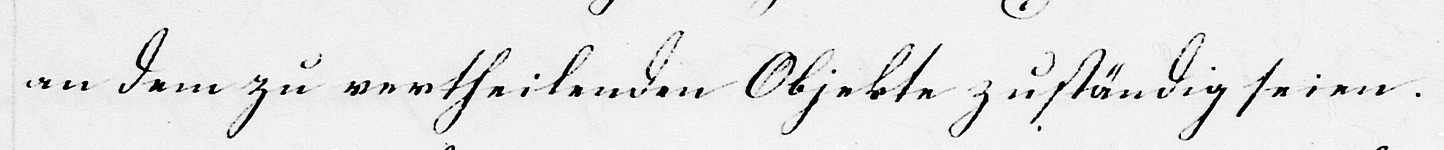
an dem zu vertheilenden Objekte zuständig seien.
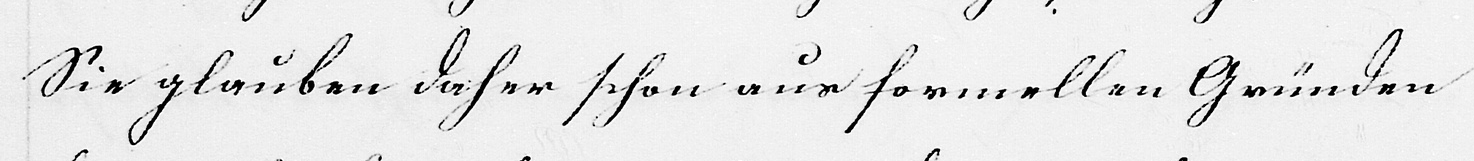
Sie glauben daher schon aus formellen Gründen
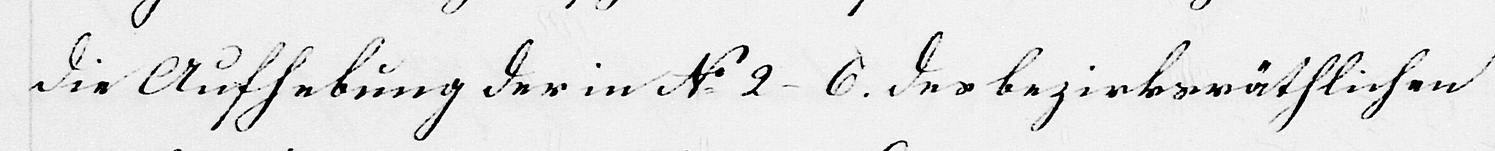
die Aufhebung der in No 2−6. des bezirksräthlichen
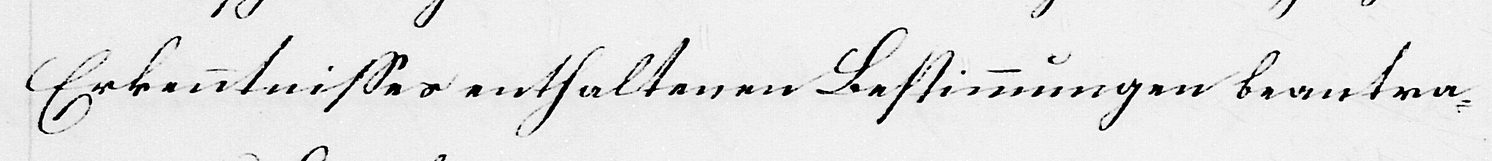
Erkenntnißes enthaltenen Bestimmungen beantra¬
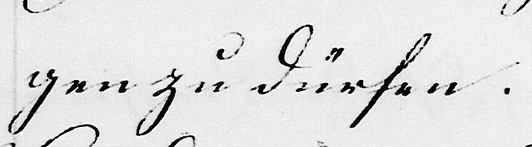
gen zu dürfen.
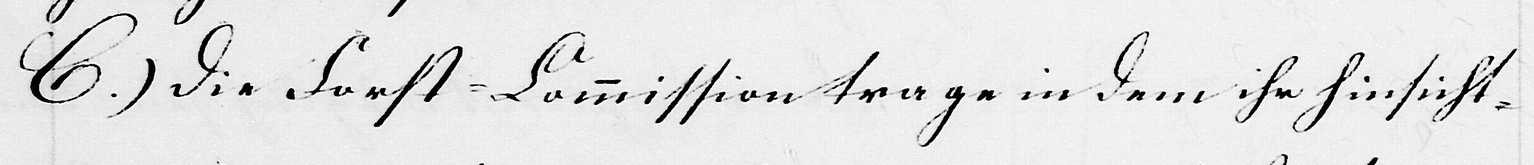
B.) Die Forst-Commission trage in dem ihr hinsicht¬
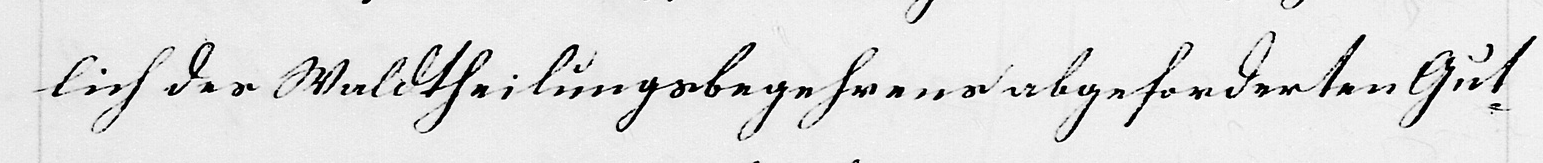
lich des Waldtheilungsbegehrens abgeforderten Gut¬
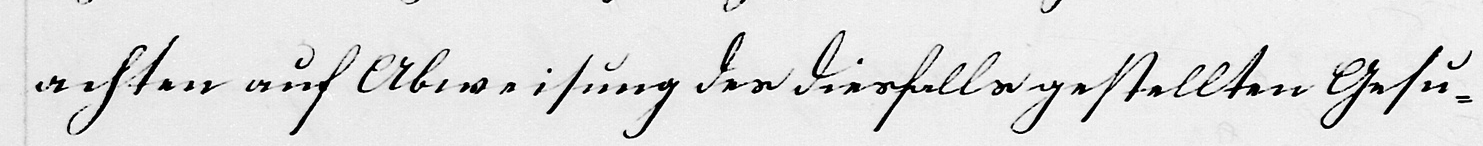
achten auf Abweisung des diesfalls gestellten Gesu¬
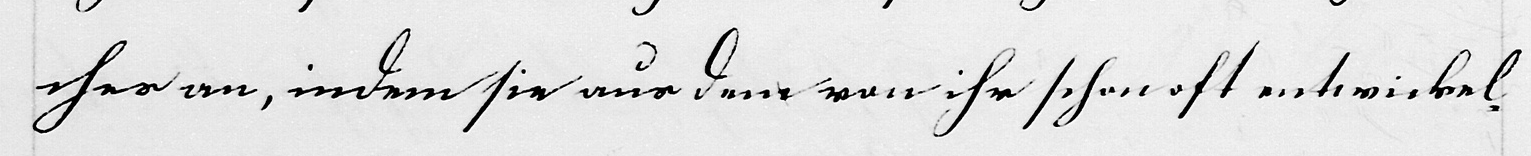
ches an, indem sie aus den von ihr schon oft entwickel¬
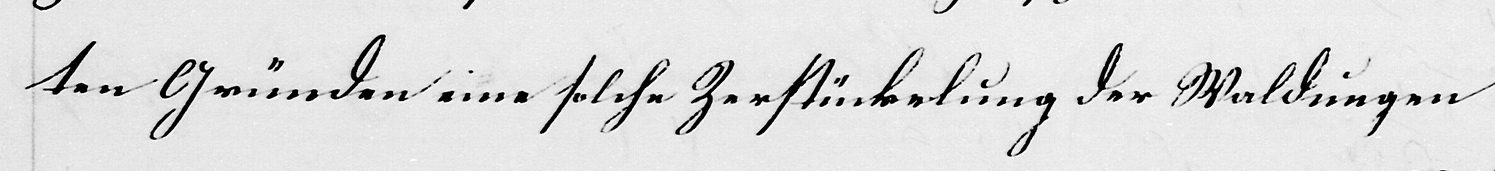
ten Gründen eine solche Zerstückelung der Waldungen
